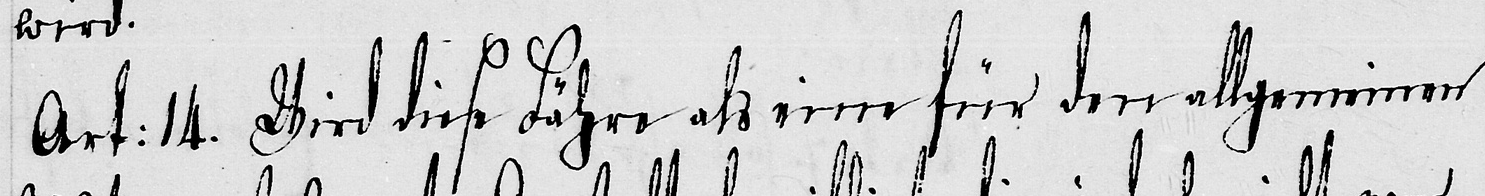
Art: 14. Wird diese Fähre als eine für den allgemeinen
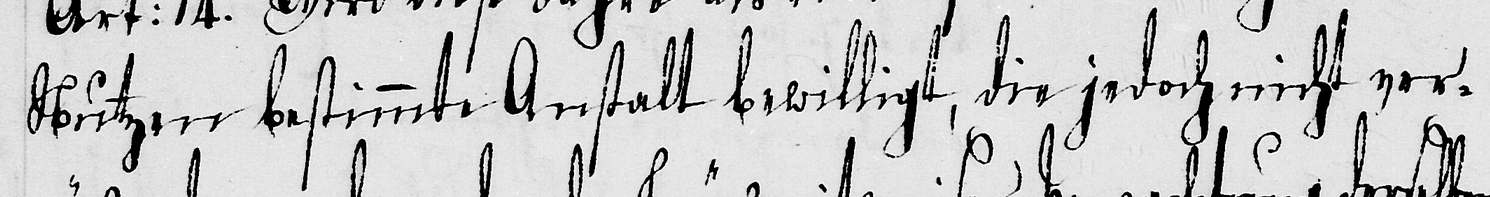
Nutzen bestimmte Anstalt bewilligt, die jedoch nicht ver¬
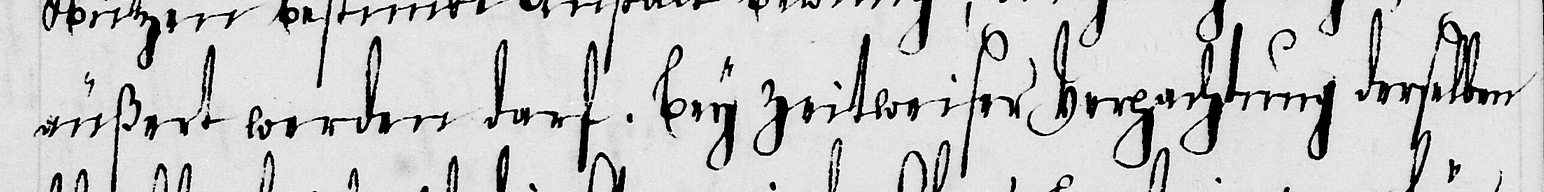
äußert werden darf. Bey zeitweiser Verpachtung derselb¬
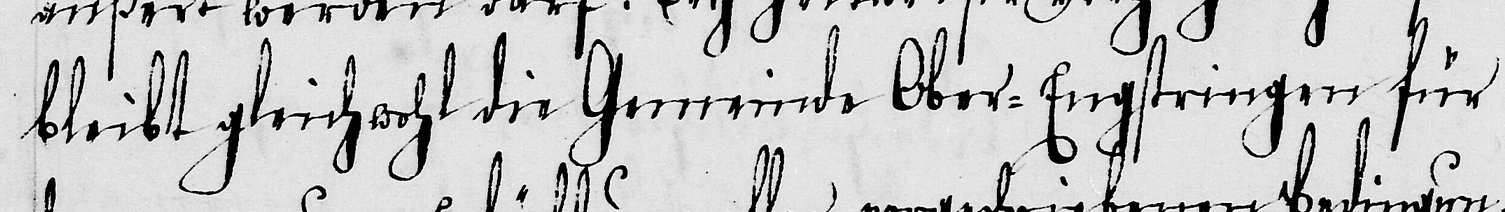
bleibt gleichwohl die Gemeinde Ober-Engstringen für
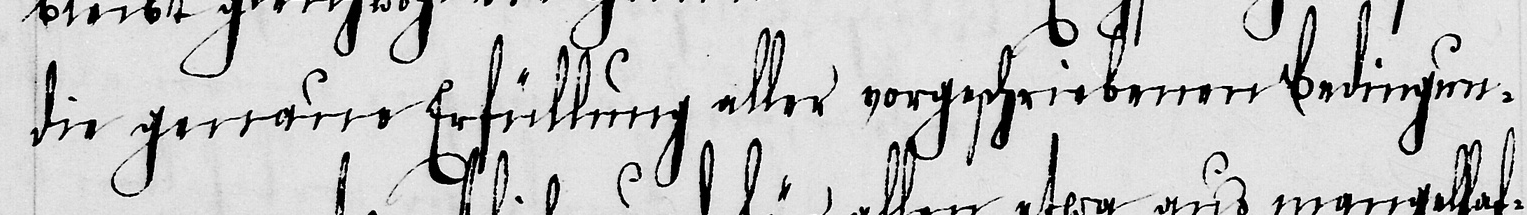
die genaue Erfüllung aller vorgeschriebenen Bedingun¬
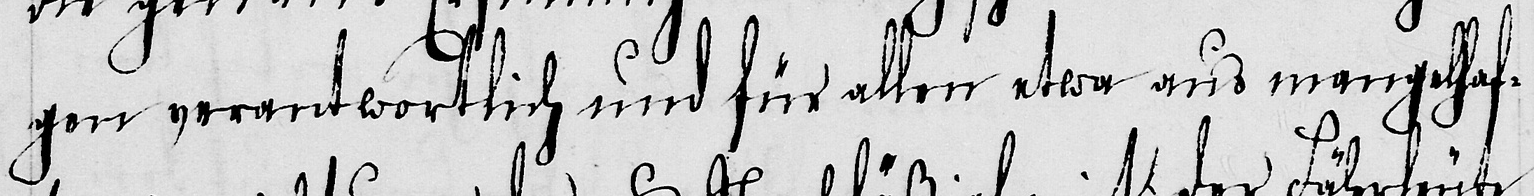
gen verantwortlich und für allen etwa aus mangelhaf¬
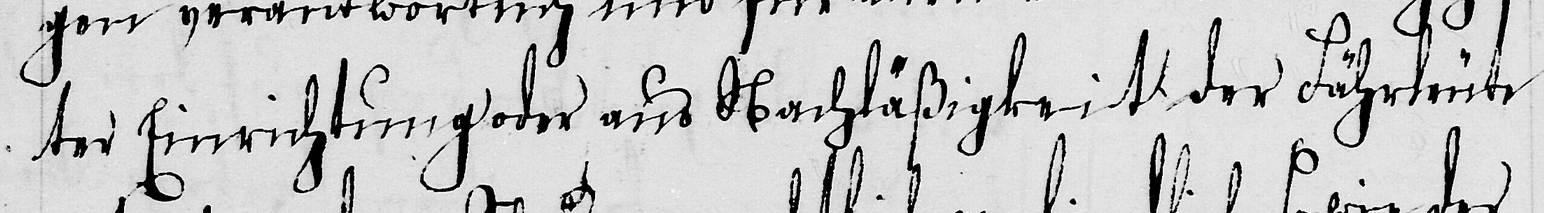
ten Einrichtungen oder aus Nachläßigkeit der Fährleute
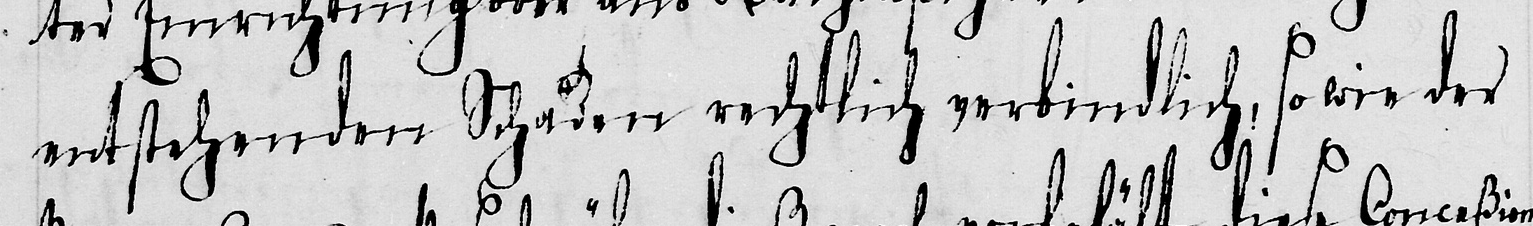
entstehenden Schaden rechtlich verbindlich, so wie der
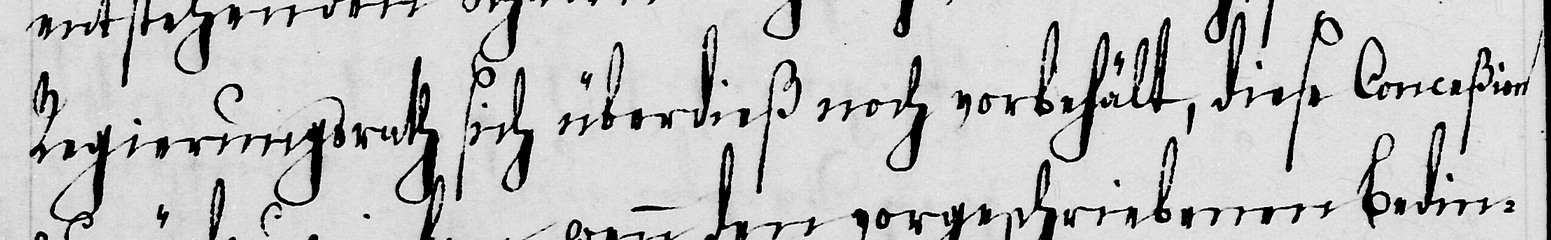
Regierungsrath sich überdieß noch vorbehält, diese Conceßion
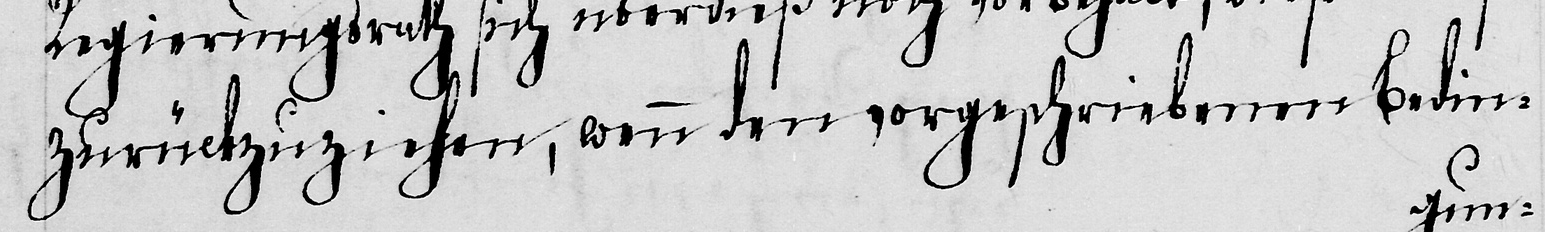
zurückzuziehen, wenn den vorgeschriebenen Bedin-
